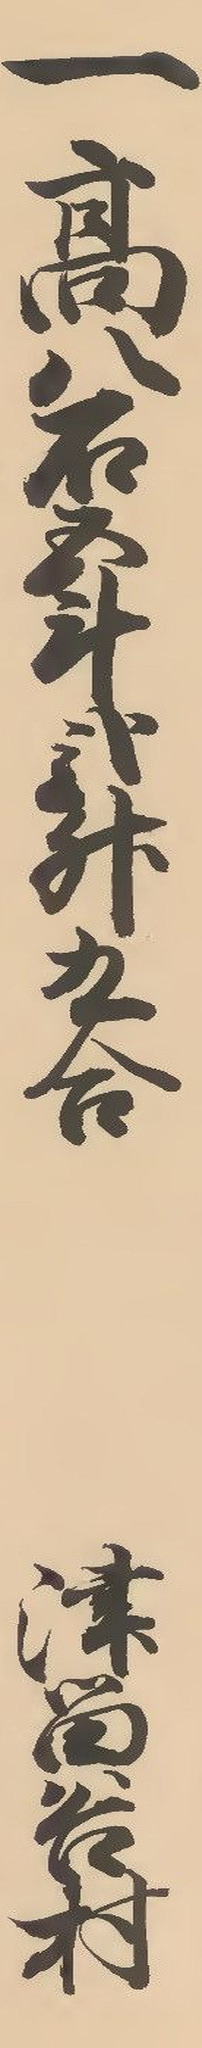一髙八石五斗弐升九合津留谷村
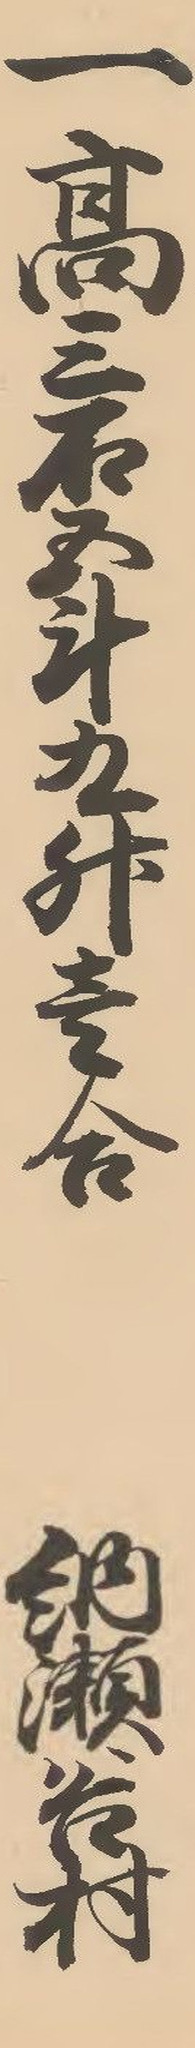一髙三石五斗九升壱合納瀬谷村

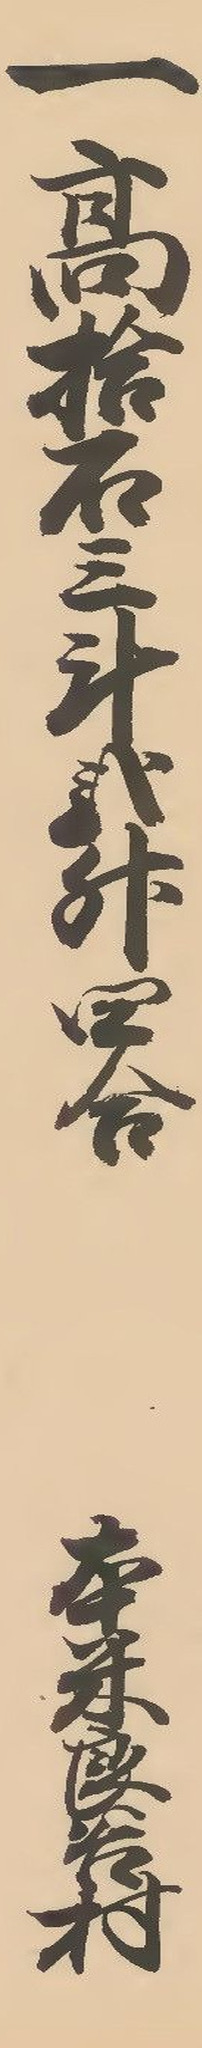一髙拾石三斗弐升四合本米良谷村
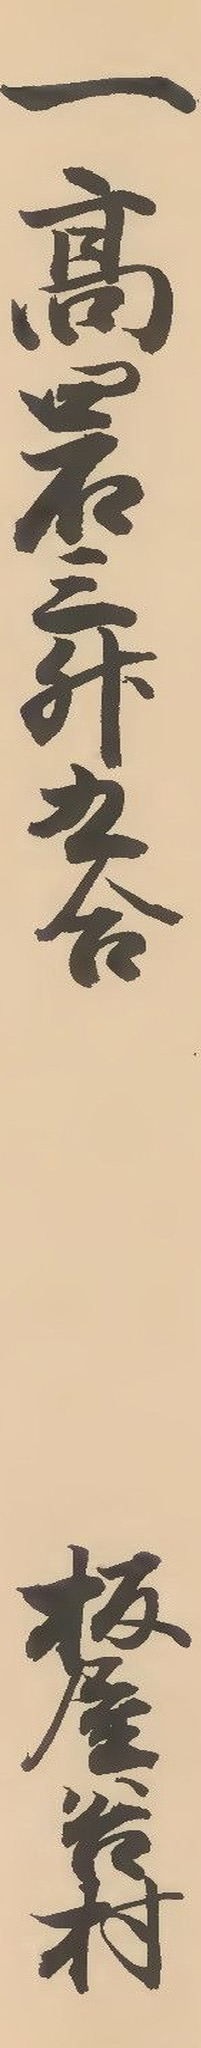一髙四石三升九合板屋谷村
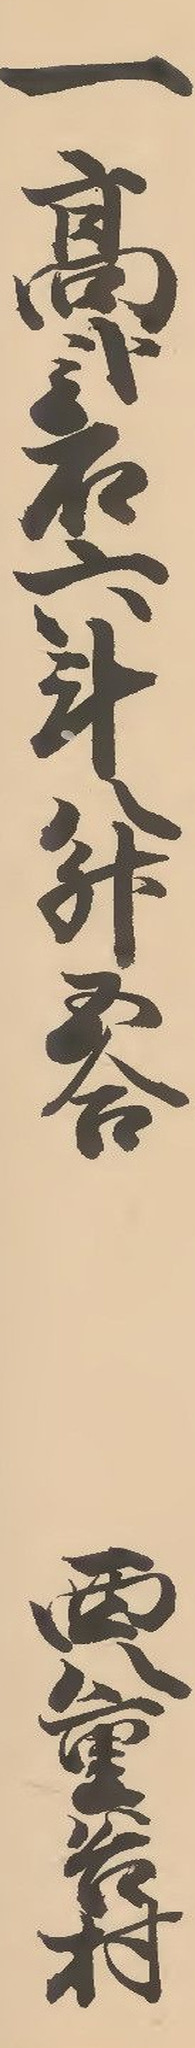一髙弐石六斗八升五合西八重谷村
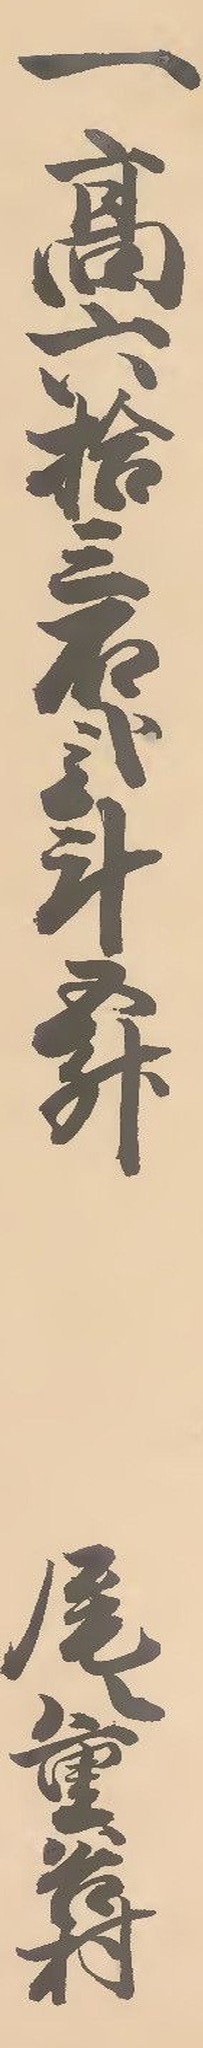一髙六拾三石弐斗五升尾八重谷村
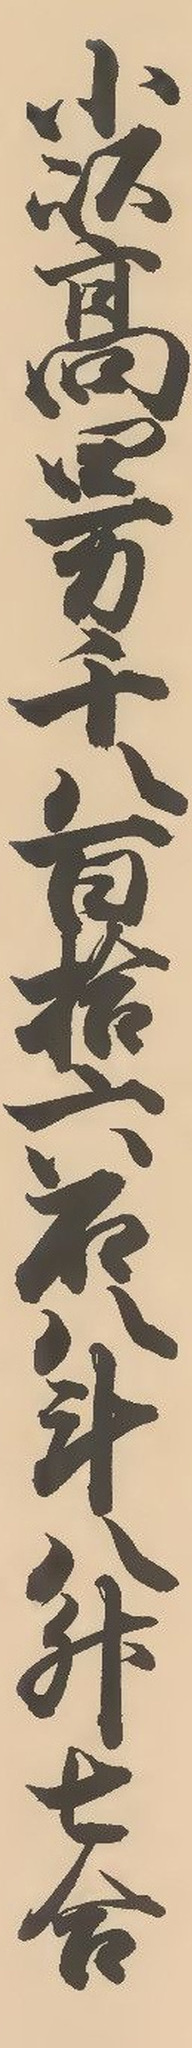小以髙四万千八百拾六石八斗八升七合

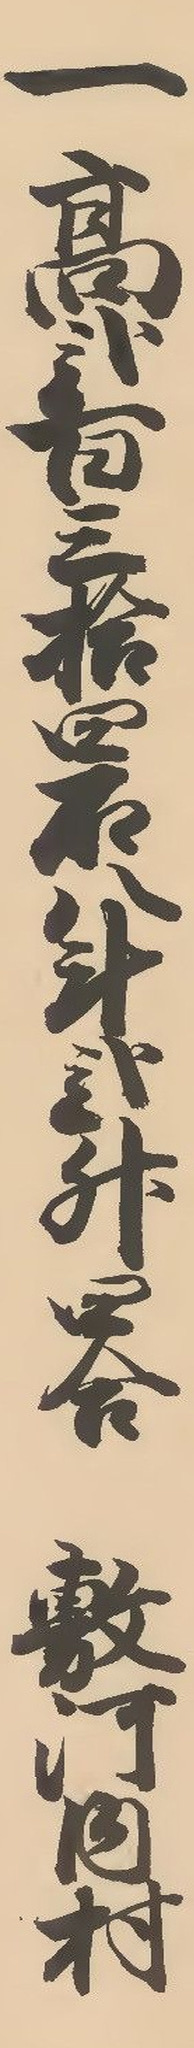一髙弐百三拾四石八斗弐升四合敷河内村
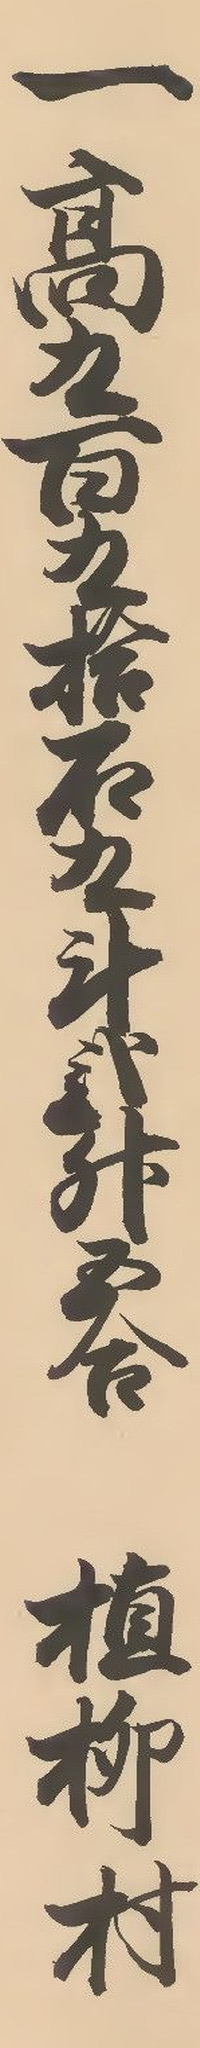一髙九百九拾石九斗弐升五合植柳村
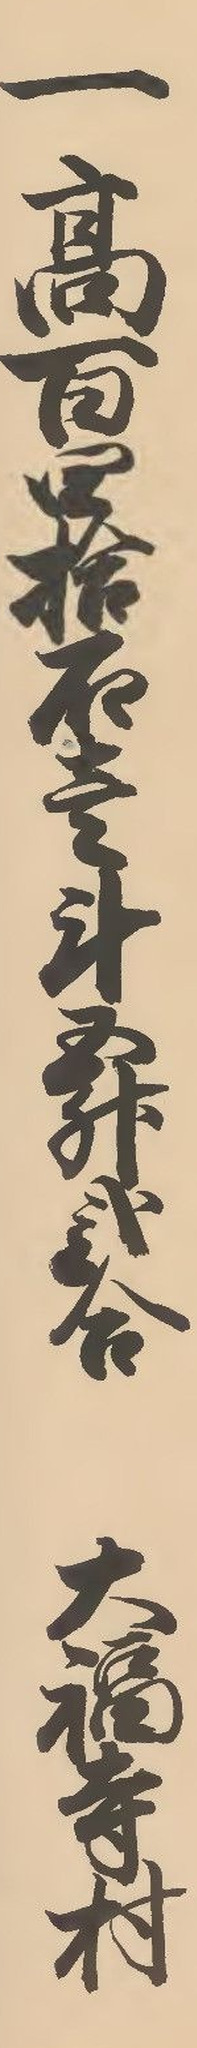一髙百四拾石壱斗五升壱合大福寺村
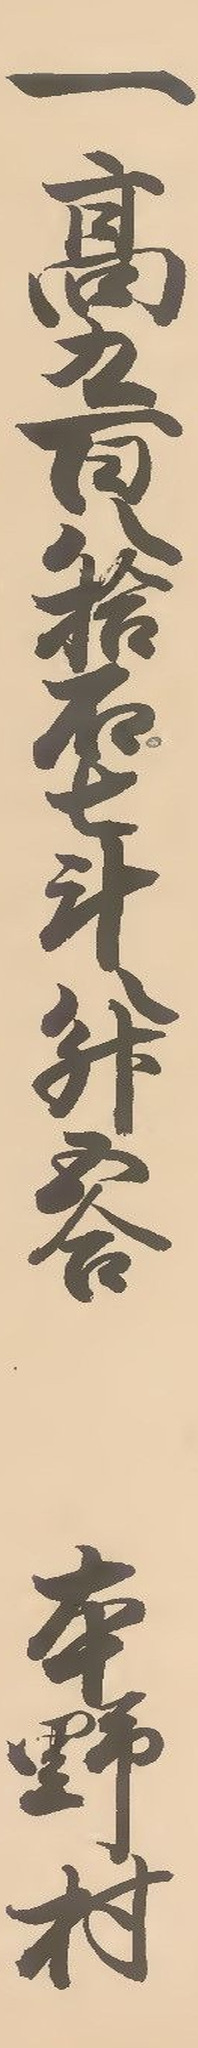一髙九百八拾石七斗八升五合本野村
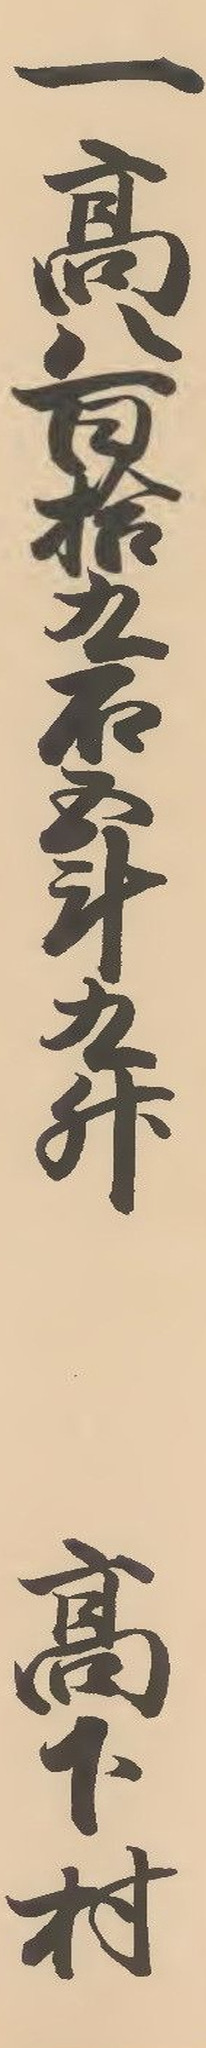一髙八百拾九石五斗九升髙下村
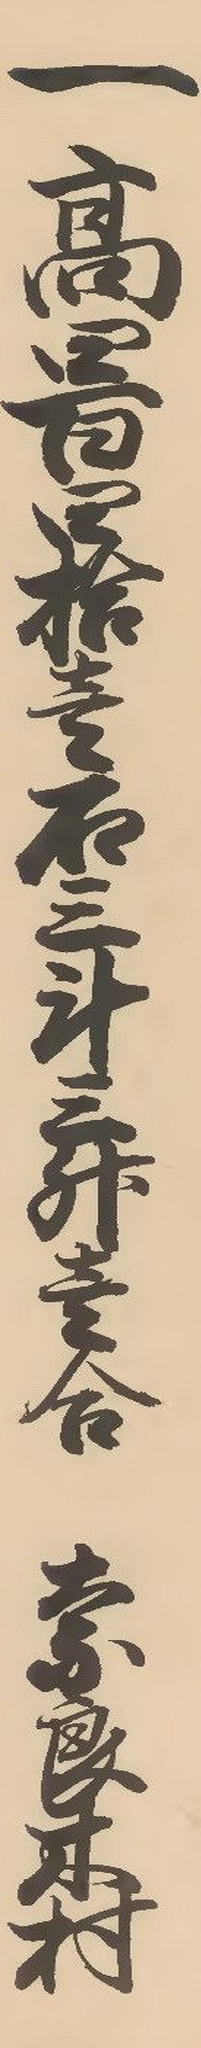一髙四百四拾壱石三斗三升壱合奈良木村
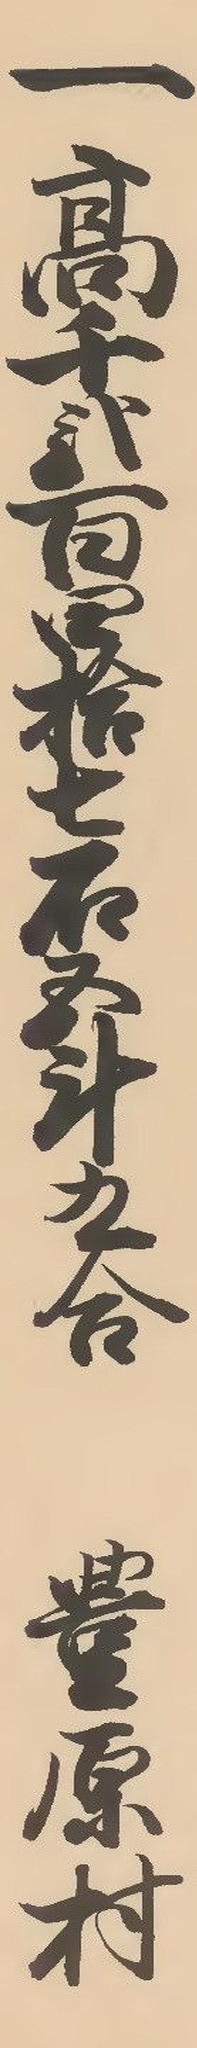一髙千二百四拾七石五斗九合豊原村

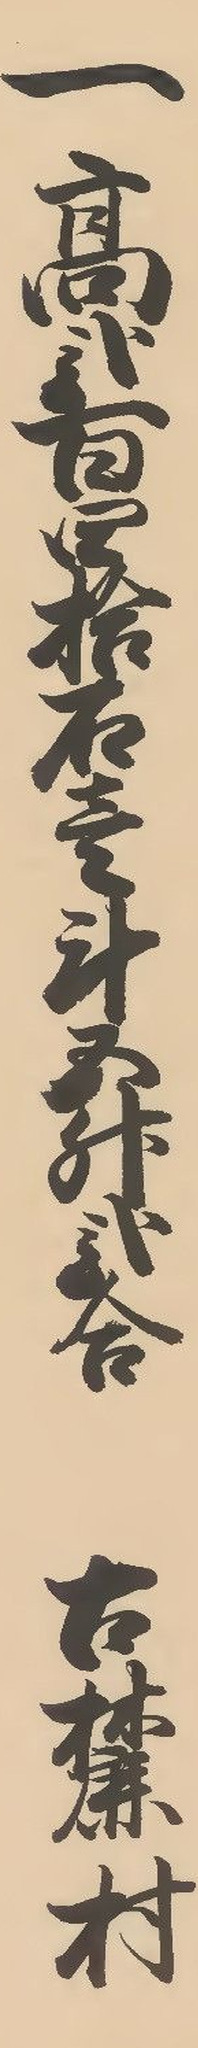一髙弐百四拾石壱斗五升弐合古麓村
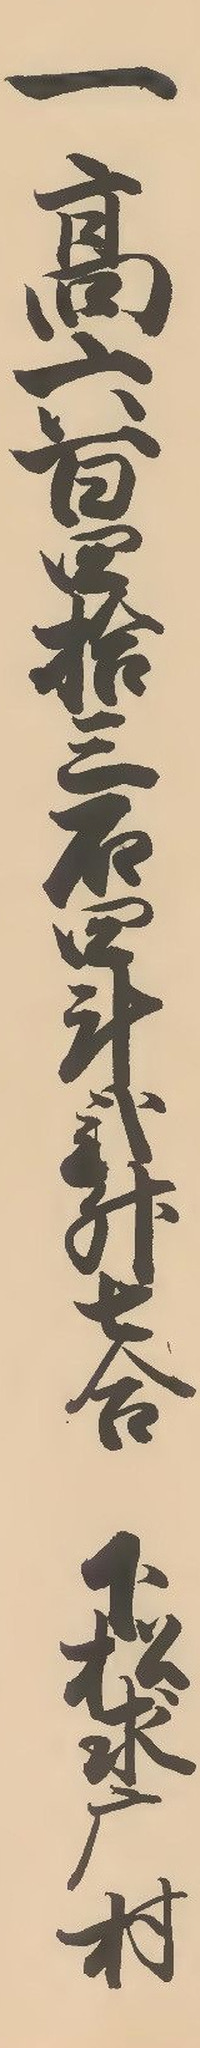一髙六百四拾三石四斗弐升七合下松求摩村
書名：肥後国郷帳
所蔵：国立公文書館 National Archives of Japan
